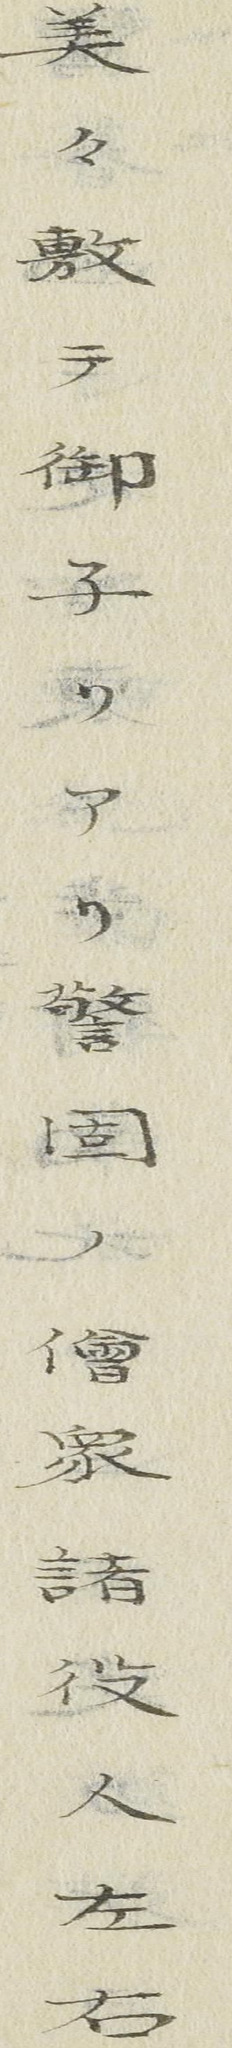美々敷テ御子リアリ警固ノ僧衆諸役人左右
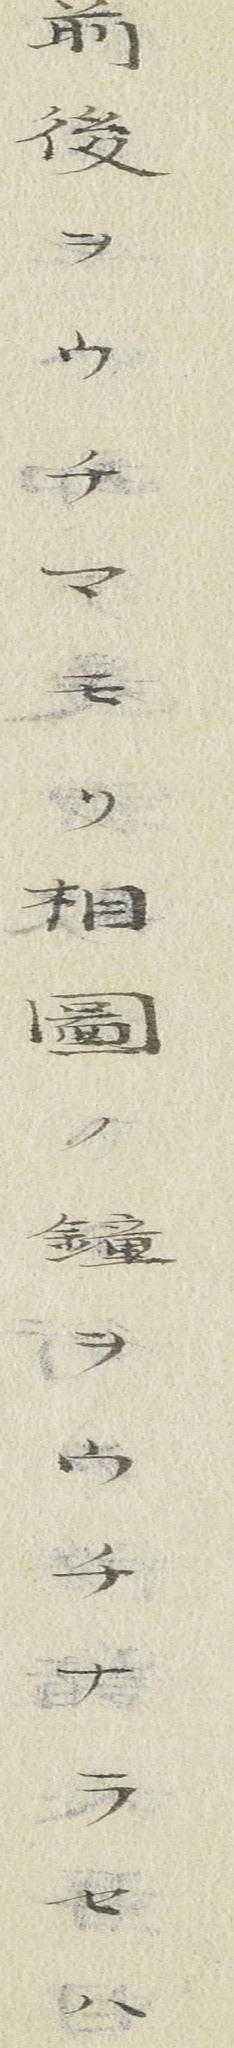前後ヲウチマモリ相図ノ鐘ヲウチナラセハ
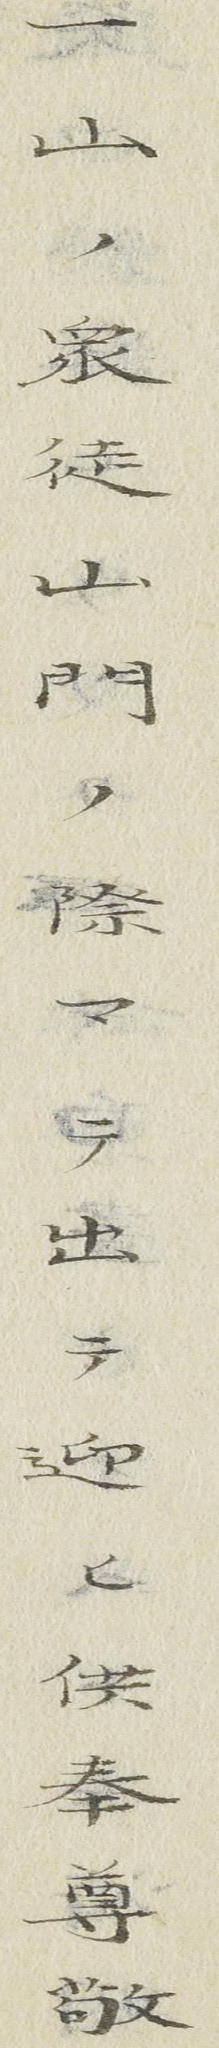一山ノ衆徒山門ノ際マテ出テ迎ヒ供奉尊敬
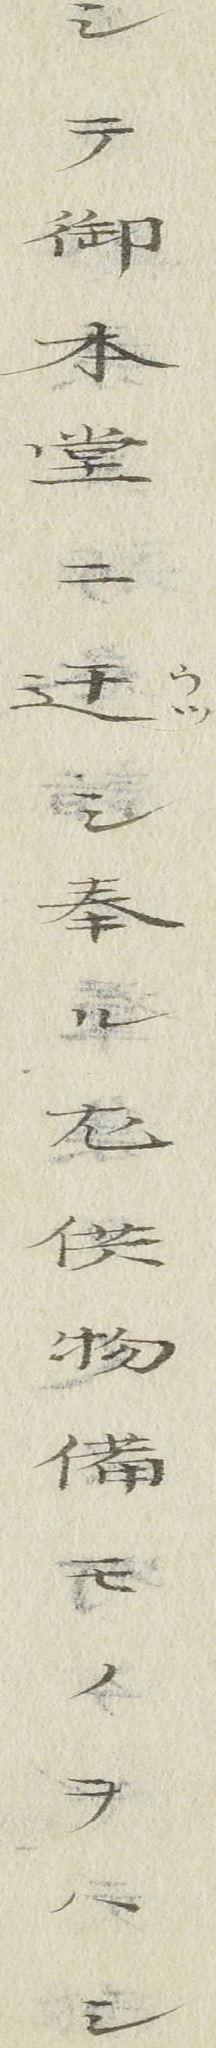シテ御本堂ニ迂シ奉ル左供物備モノヲハシ
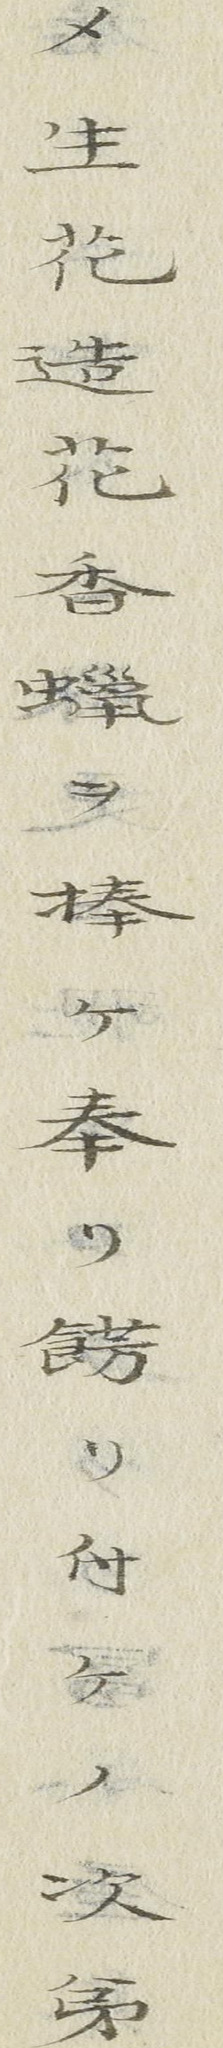メ生花造花香蝋ヲ捧ケ奉リ餝リ付ケノ次第
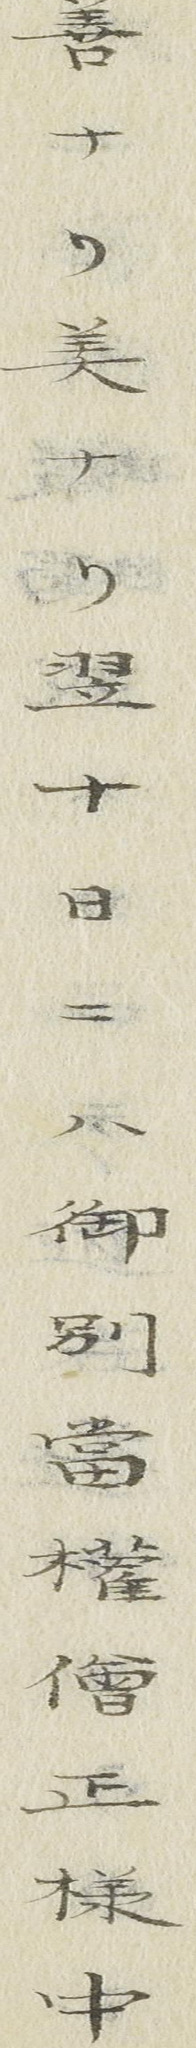善ナリ美ナリ翌十日ニハ御別当権僧正様中
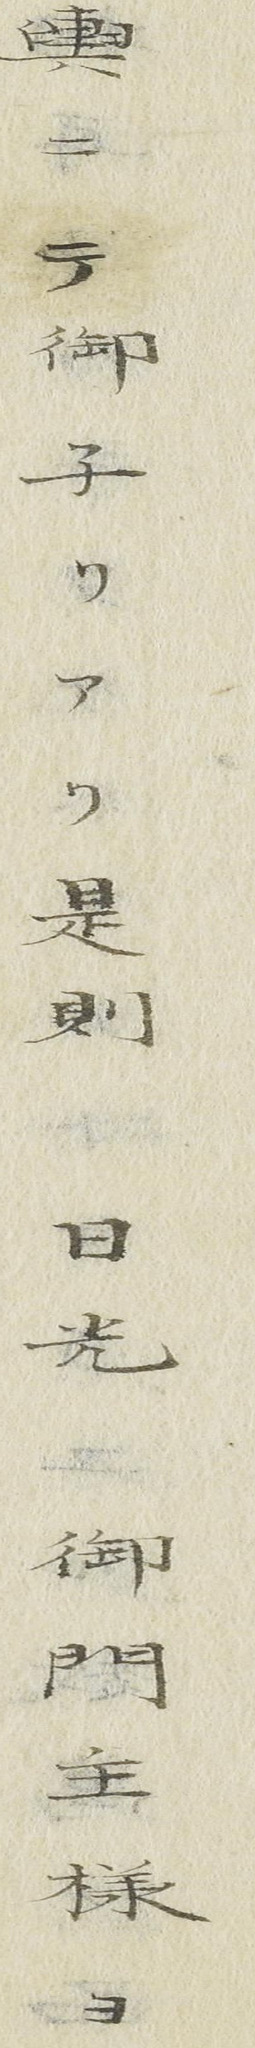輿ニテ御子リアリ是則日光御門主様ヨ
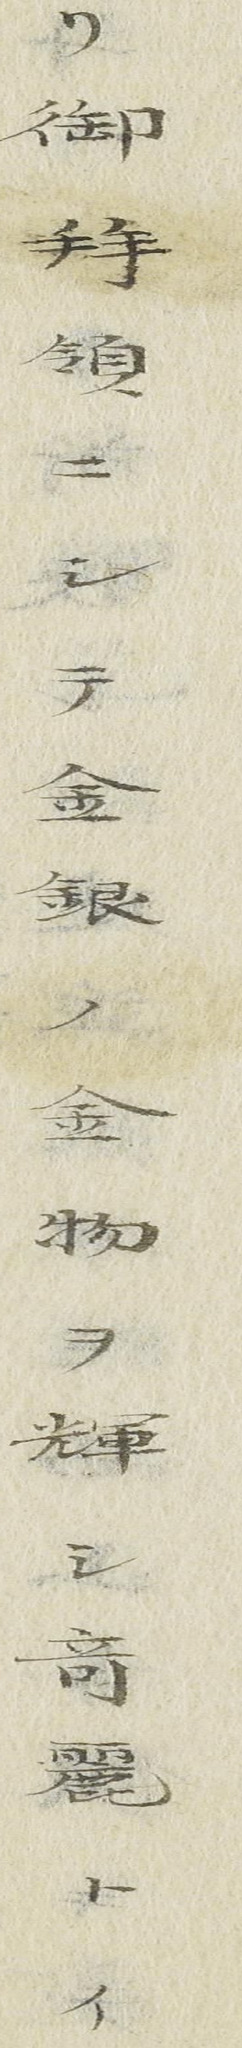リ御拝領ニシテ金銀ノ金物ヲ輝シ奇麗トイ
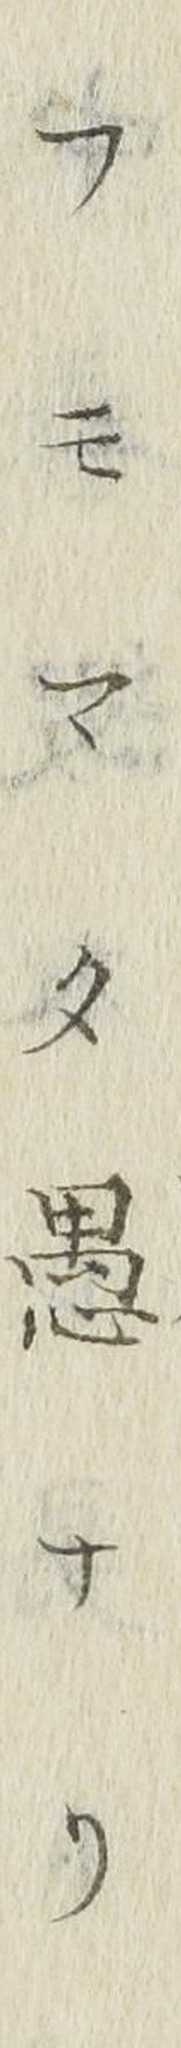フモマタ愚ナリ
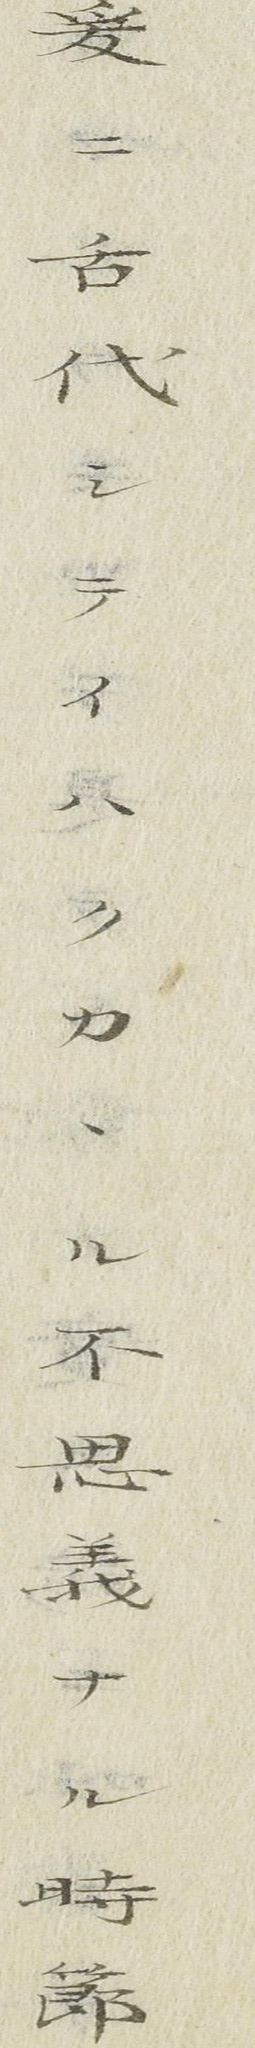爰ニ舌代シテイハクカヽル不思義ナル時節
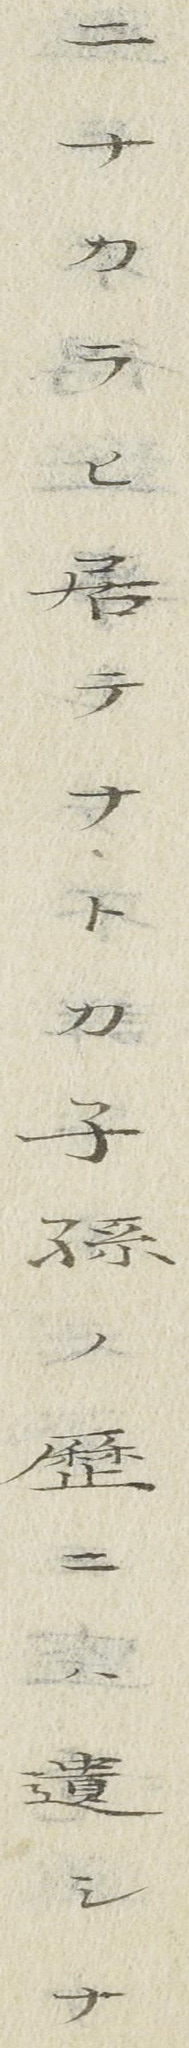ニナカラヒ居テナトカ子孫ノ歴ニハ遺シナ
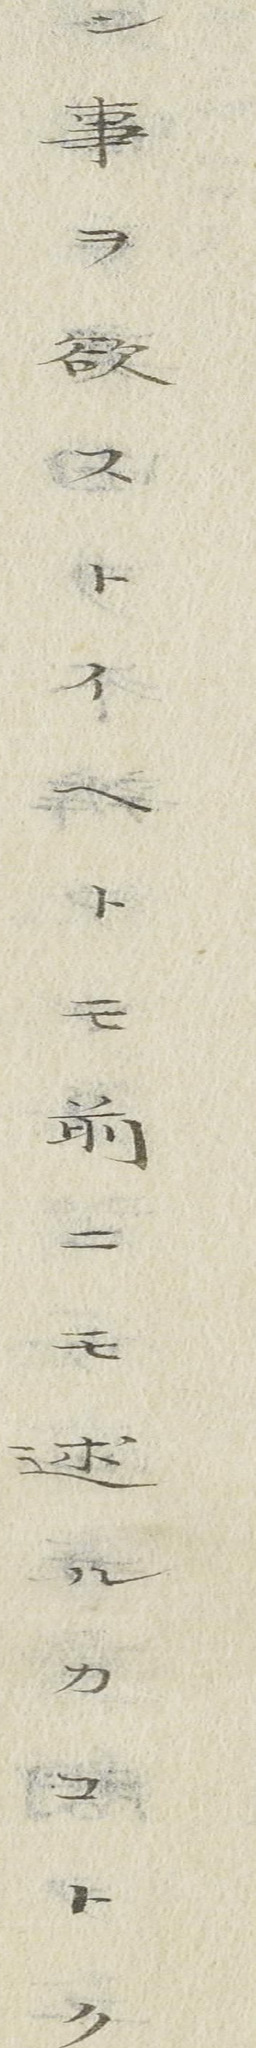シ事ヲ欲ストイヘトモ前ニモ述ルカコトク
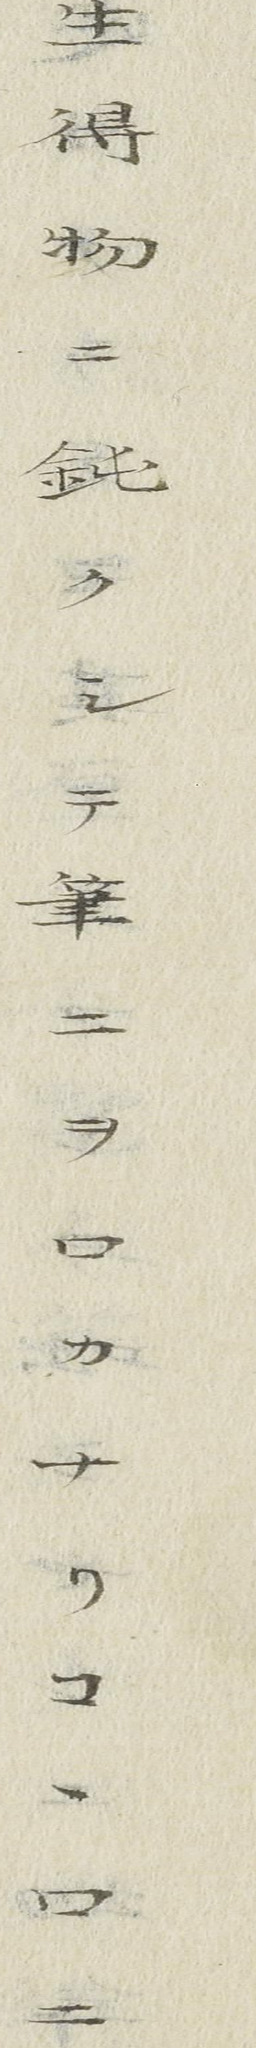生得物ニ鈍クシテ筆ニヲロカナリコヽロニ
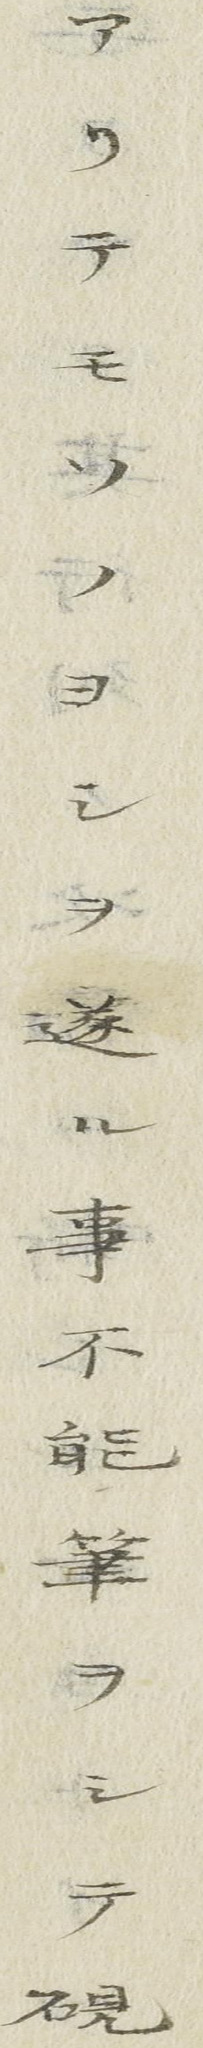アリテモソノヨシヲ遂ル事不能筆ヲシテ硯
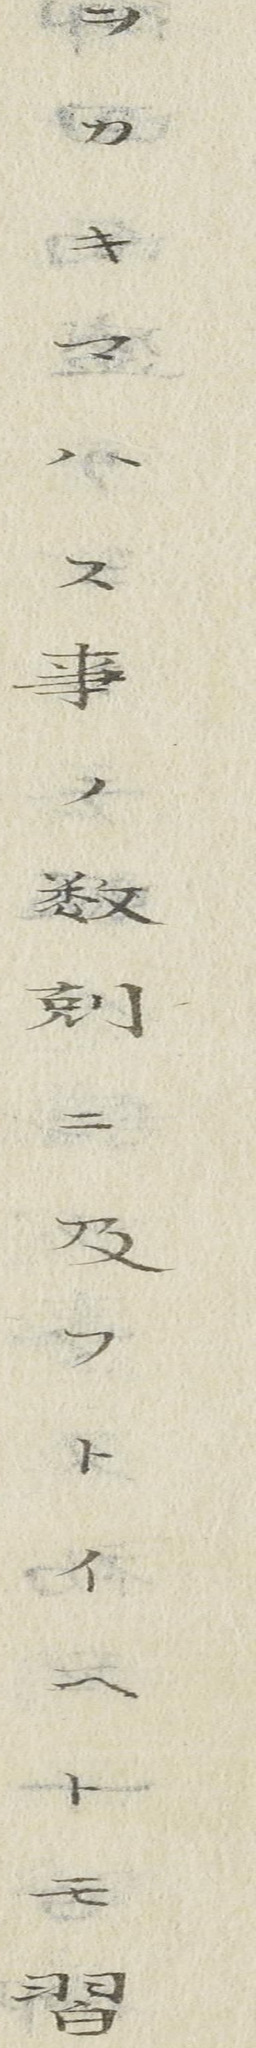ヲカキマハス事ノ数刻ニ及フトイヘトモ習
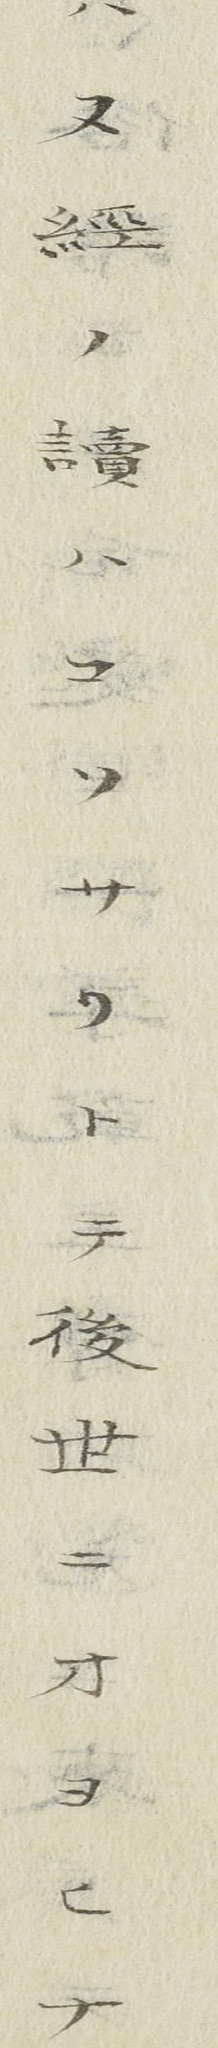ハス経ノ読ハコソサリトテ後世ニオヨヒナ
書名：地災撮要　地震之部　巻ノ二
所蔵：東京大学地震研究所図書室 Earthquake Research Institute Library, The University of Tokyo, JAPAN
